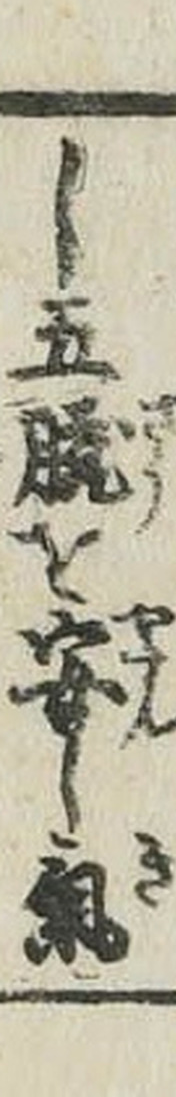し五臓を安し気
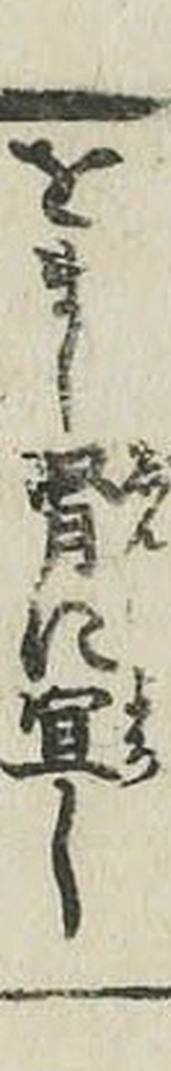をまし腎に宜し
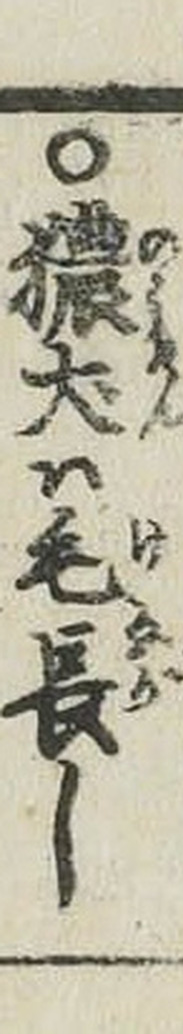○㺜犬は毛長し
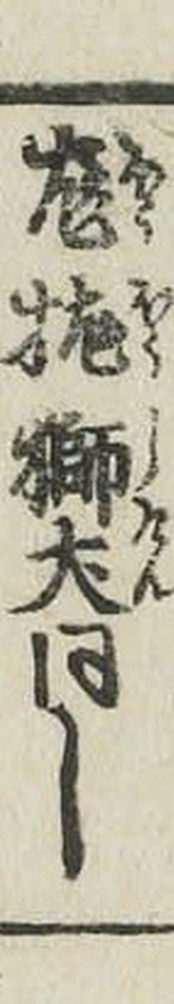尨狵獅犬同し
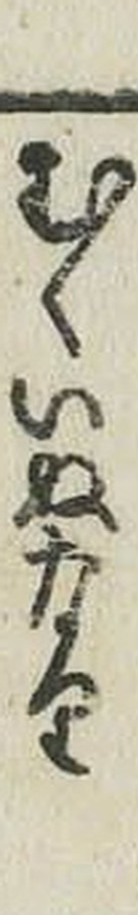むくいぬなり
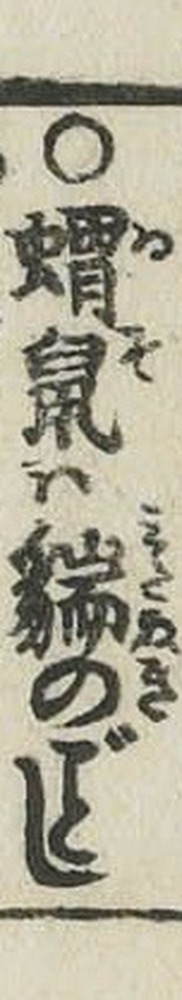○蝟鼠は貒のごとし
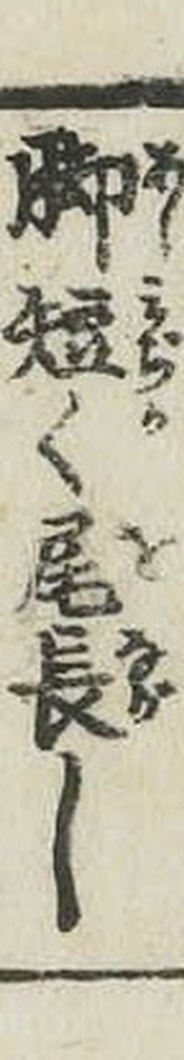脚短く尾長し
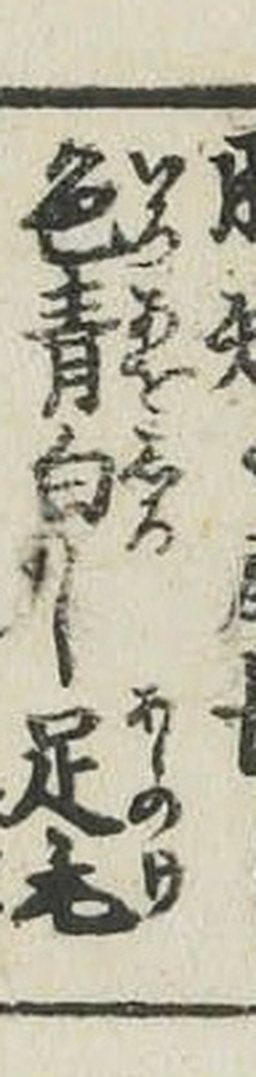色青白し足毛
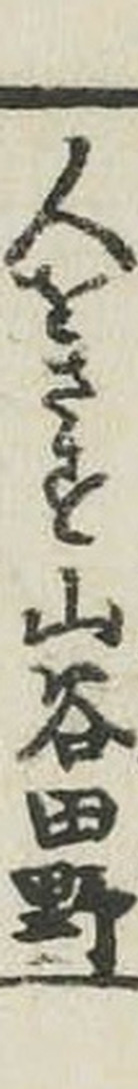人をさす山谷田野
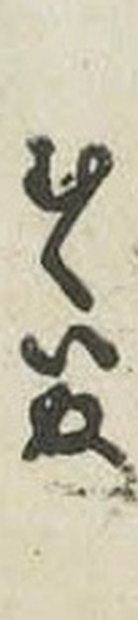むくいぬ
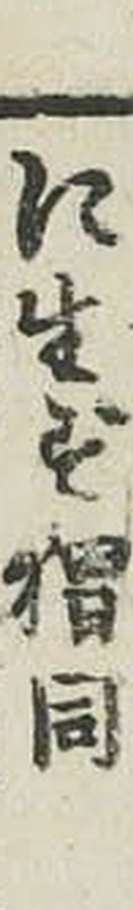に生ず猬同
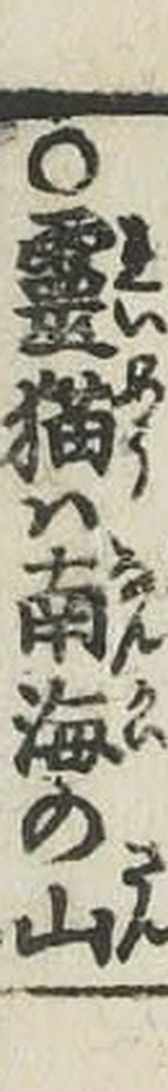○霊猫は南海の山
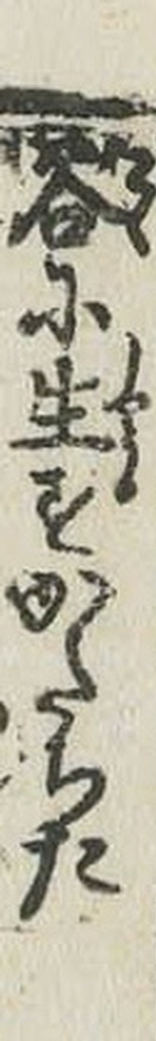谷に生すかたちた
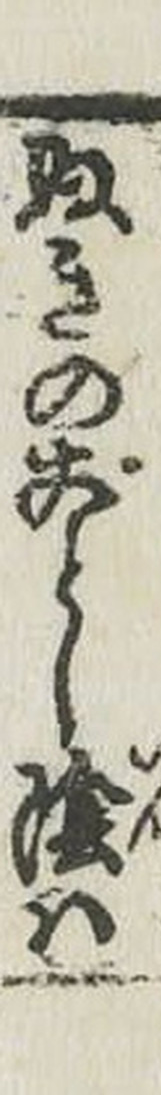ぬきのごとし陰は
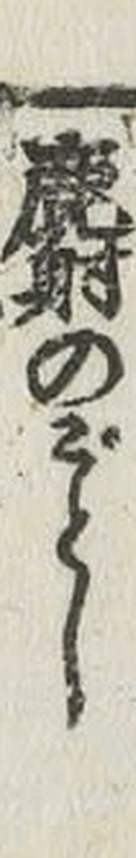麝のごとし
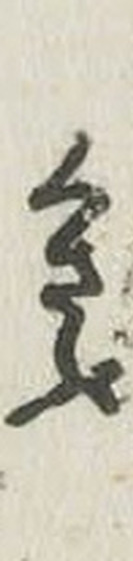くさぶ
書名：増補頭書訓蒙図彙大成 10巻 6:巻之12-13
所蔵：東京学芸大学教育コンテンツアーカイブ
